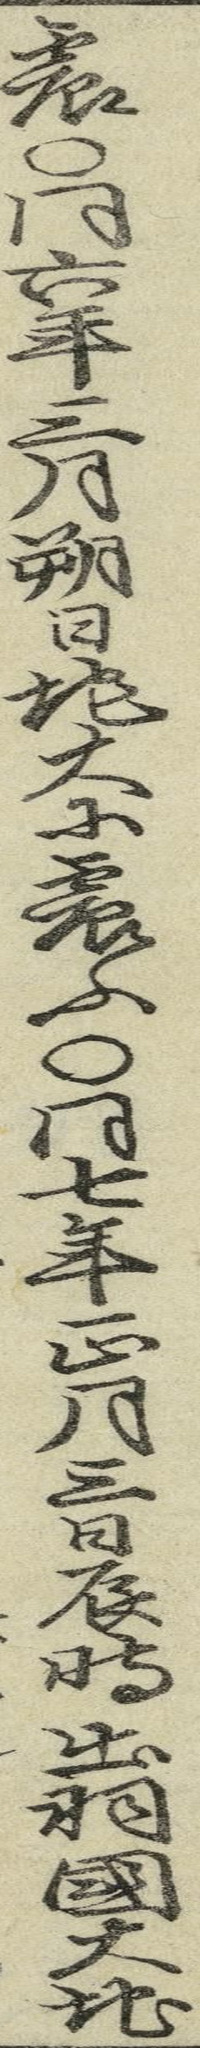震○同六年三月朔日地大に震ふ○同七年正月三日辰時出羽国大地
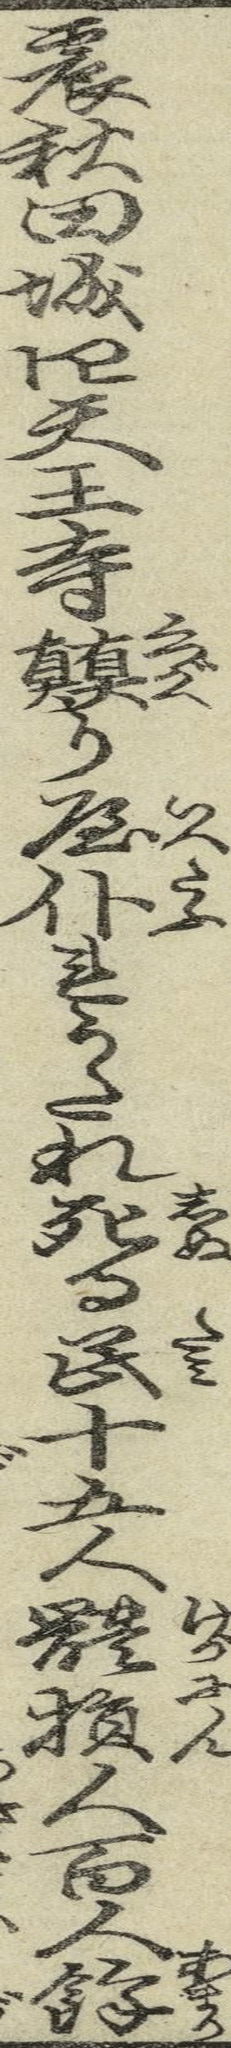震秋田城四天王寺顛り屋仆れうたれ死る民十五人体損人百人余
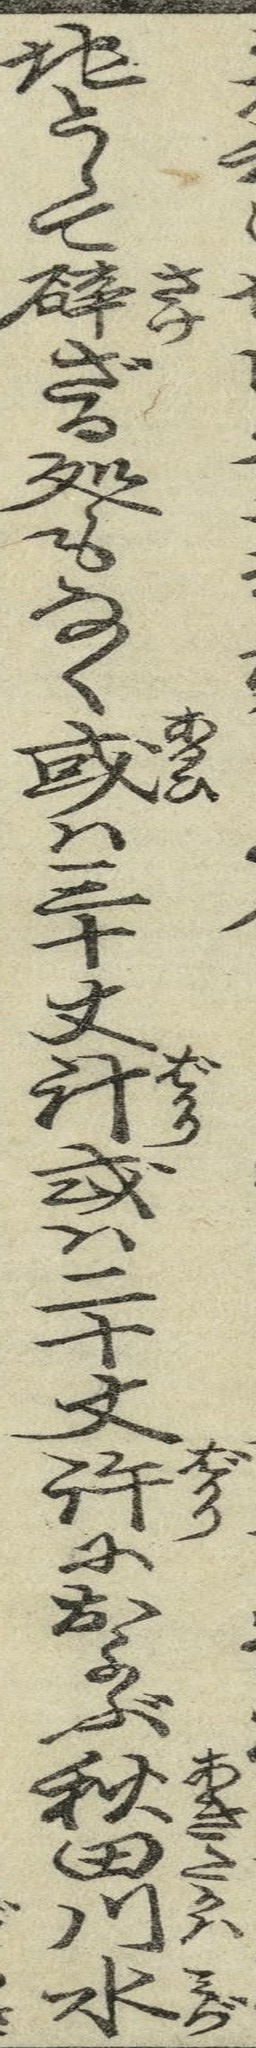地として辟ざる処もなく或は三十丈計或は二十丈許におよぶ秋田川水
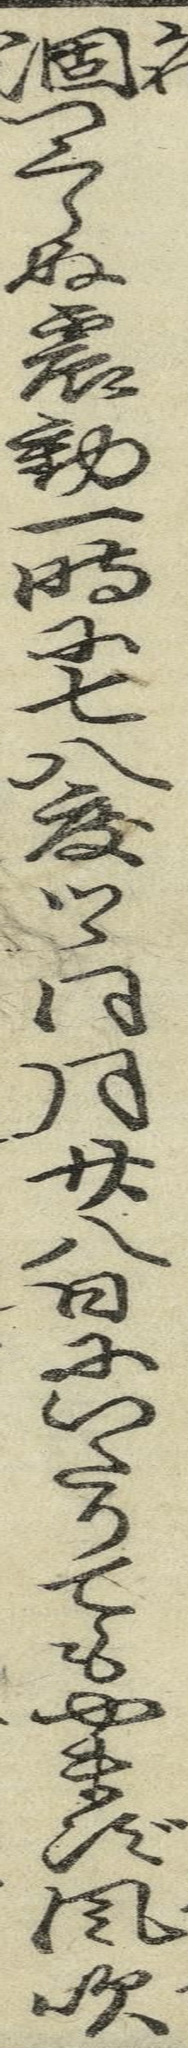涸つくしぬ震動一時に七八度つゝ同月廿八日にいたりてもやまず風吹
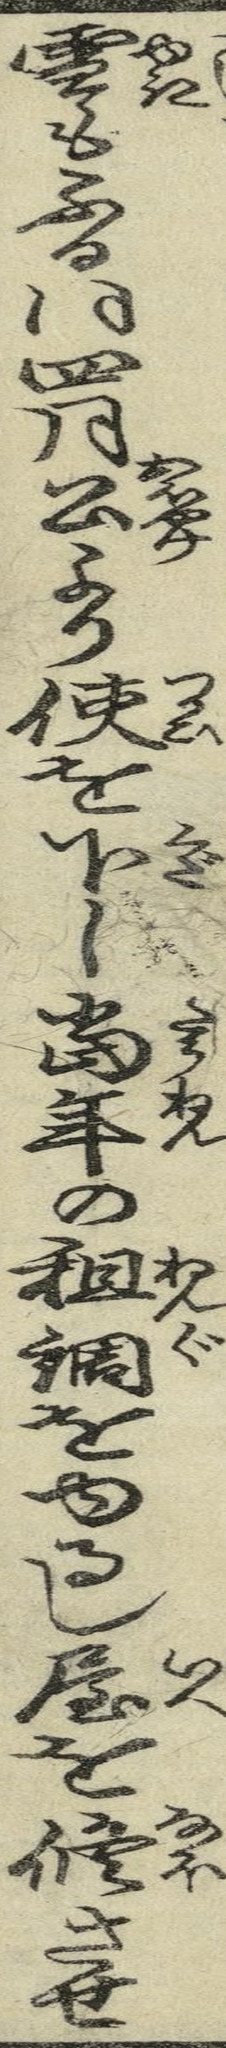雪もふる同四月公より使を下し当年の租調をゆるし屋を修させ
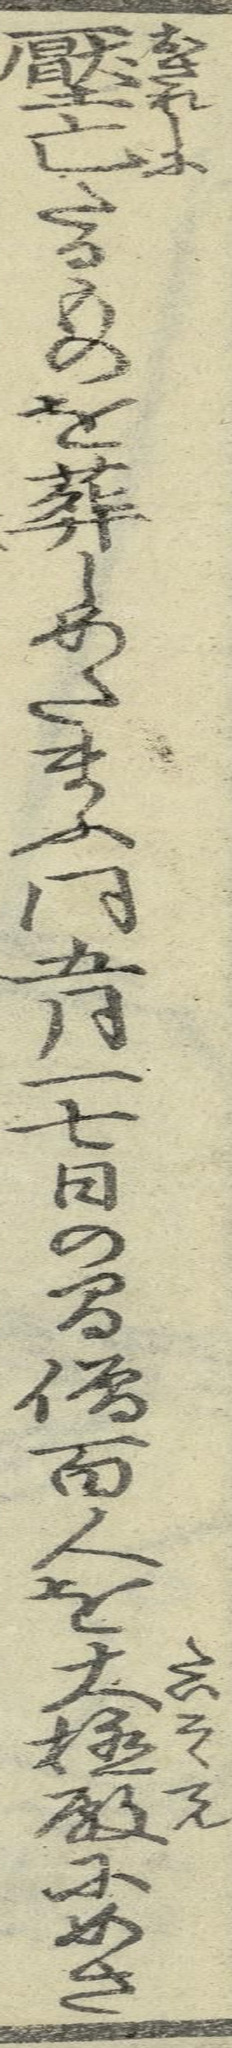圧亡たるものを葬しめたまふ同五月一七日の間僧百人を大極殿にめさ
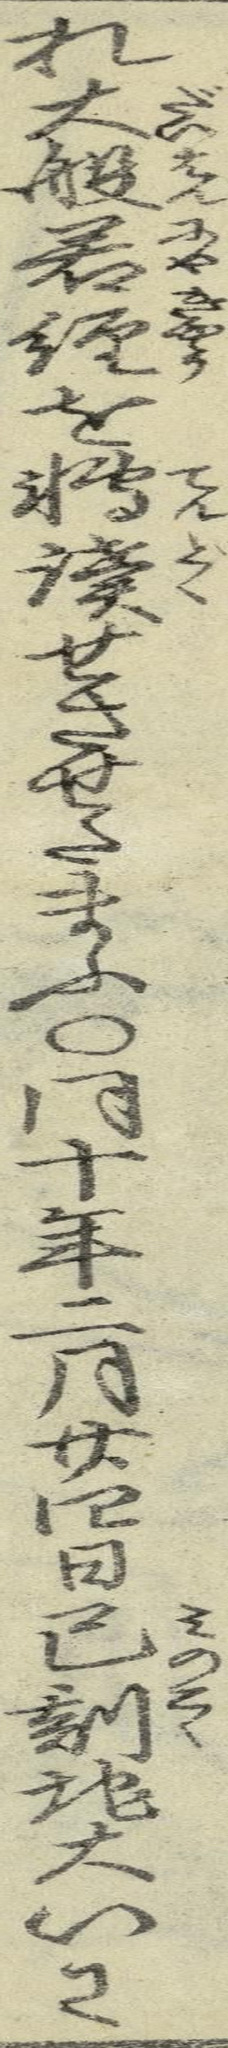れ大般若経を転読せさせたまふ○同十年二月廿四日巳刻地大いに
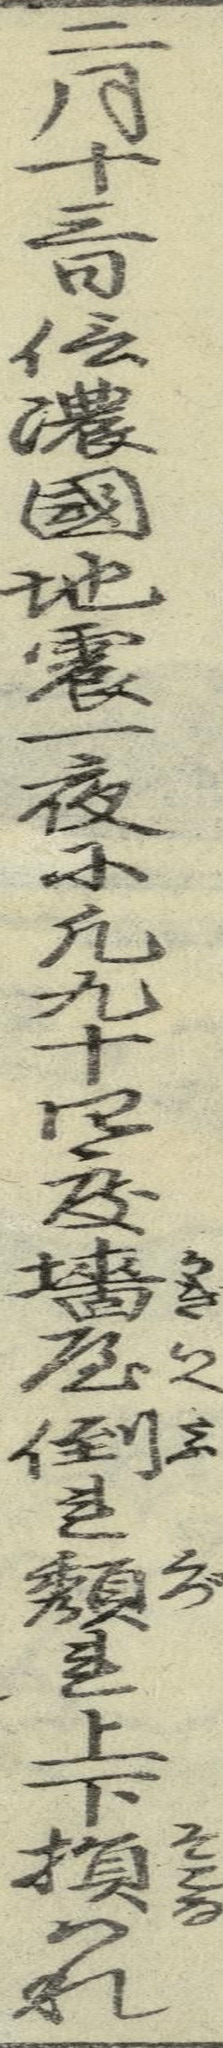二月十三日信濃国地震一夜に凡九十四度墻屋倒れ頽れ上下損はれ
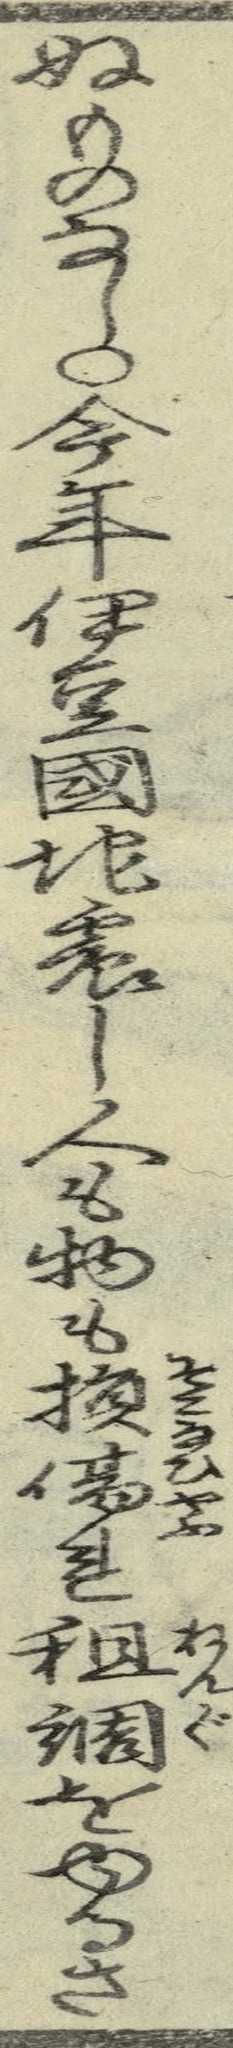ぬものなし○今年伊豆国地震し人も物も損傷れ租調をゆるさ
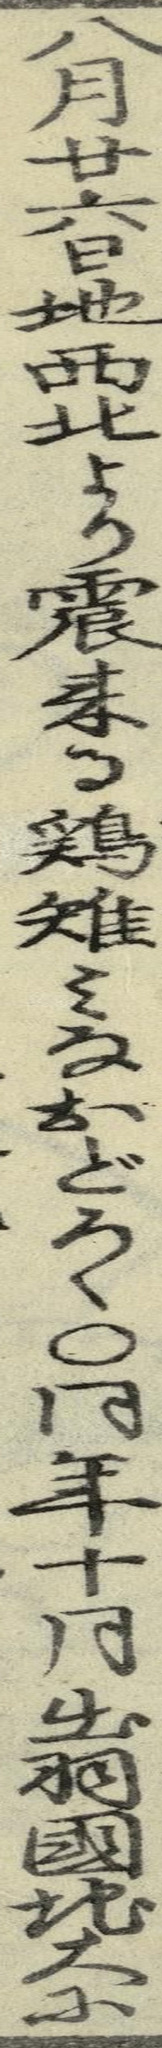八月廿六日地西北より震来る鶏雉みなおどろく〇同年十月出羽国地大に
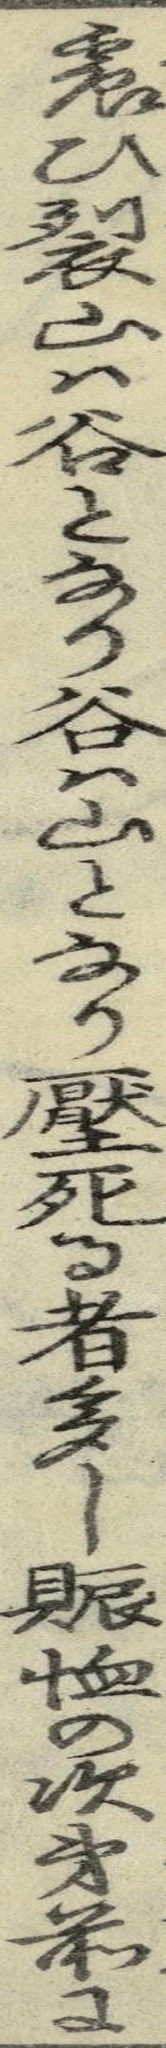震ひ裂山は谷となり谷は山となり圧死る者多し賑恤の次第前に
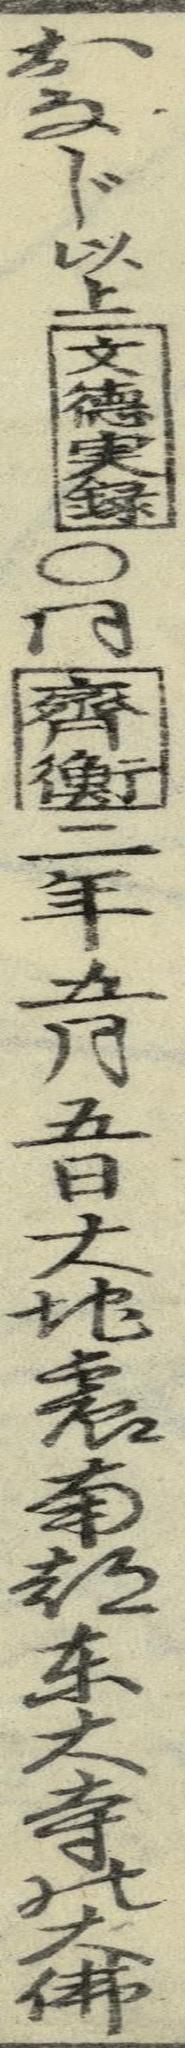おなじ以上文徳実録〇同齊衡二年五月五日大地震南都東大寺の大佛
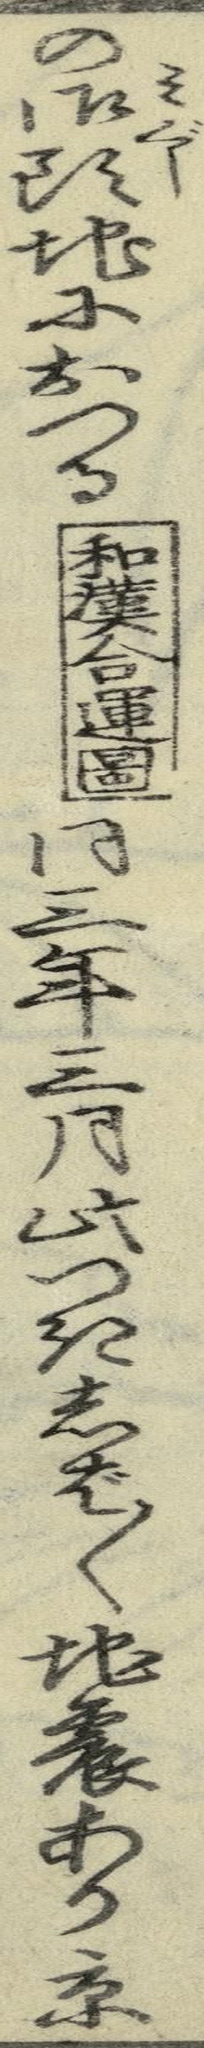の御頭地におつる和漢合運図同三年三月此つきしば〳〵地震あり京
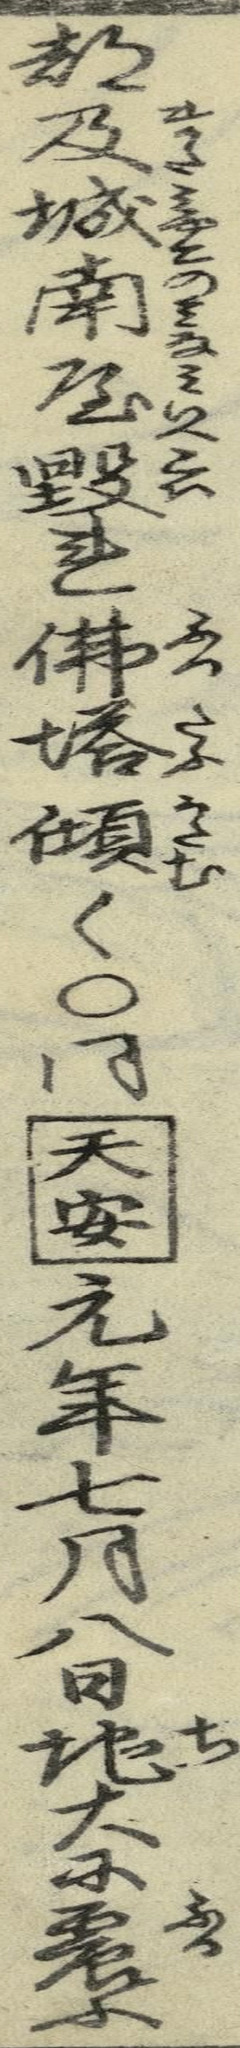都及城南屋毀れ佛塔傾く〇同天安元年七月八日地大に震ふ

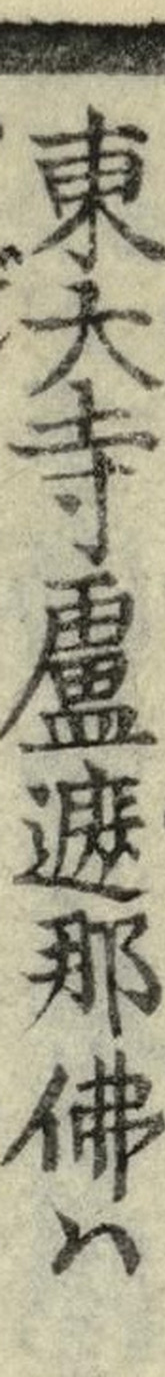東大寺盧遮那佛は
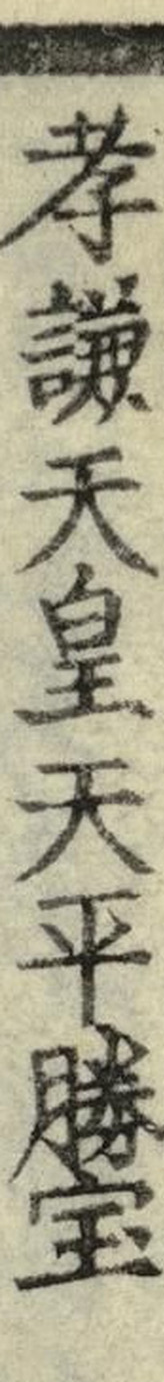孝謙天皇天平勝宝
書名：地震年代記
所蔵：東京大学地震研究所図書室 Earthquake Research Institute Library, The University of Tokyo, JAPAN
